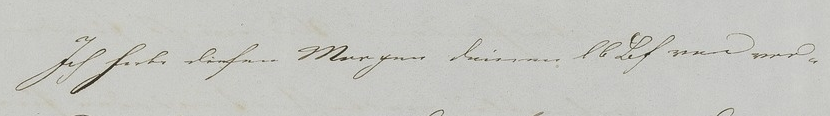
Ich habe diesen Morgen deinen lb Bf von vor-
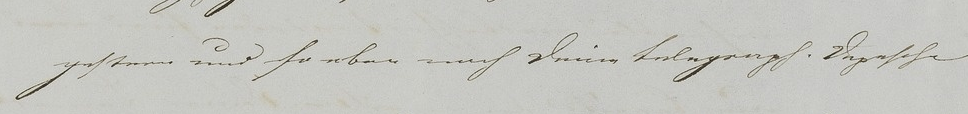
gestern und so eben auch Deine telegraph. Depesche
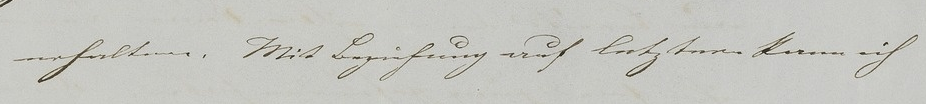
erhalten. Mit Beziehung auf letztere kann ich
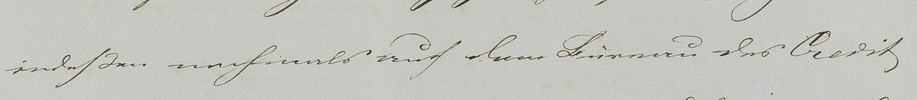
indeßen mehrmals auf dem Büreau des Credit
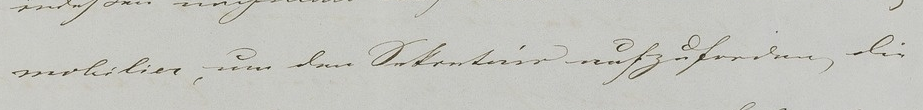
mobilier, um den Sekretair aufzufordern, die
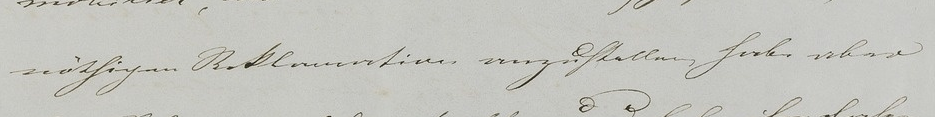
nöthigen Reklamation anzustellen, habe aber
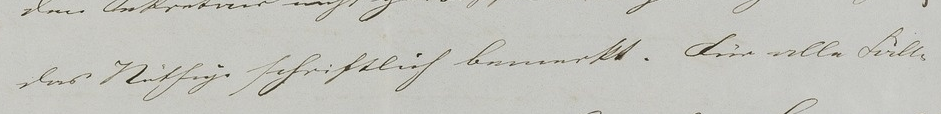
das Nöthige schriftlich bemerkt. Für alle Fälle
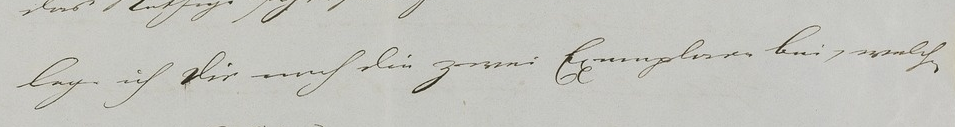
lege ich Dir noch die zwei Exemplare bei, welche
